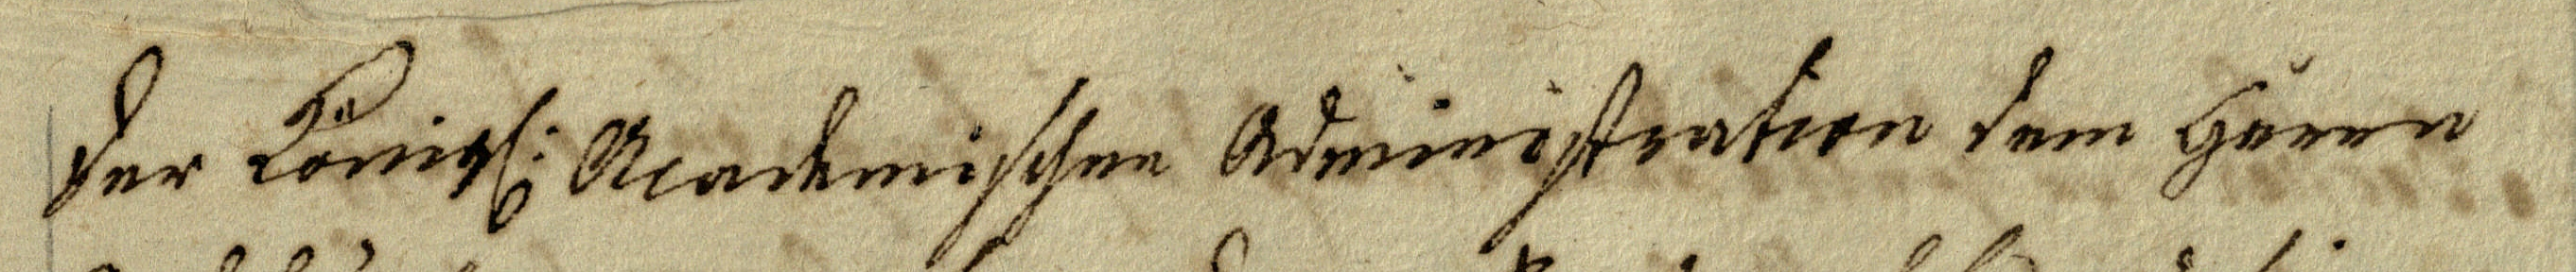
der Königl. Academischen Administration dem Herrn
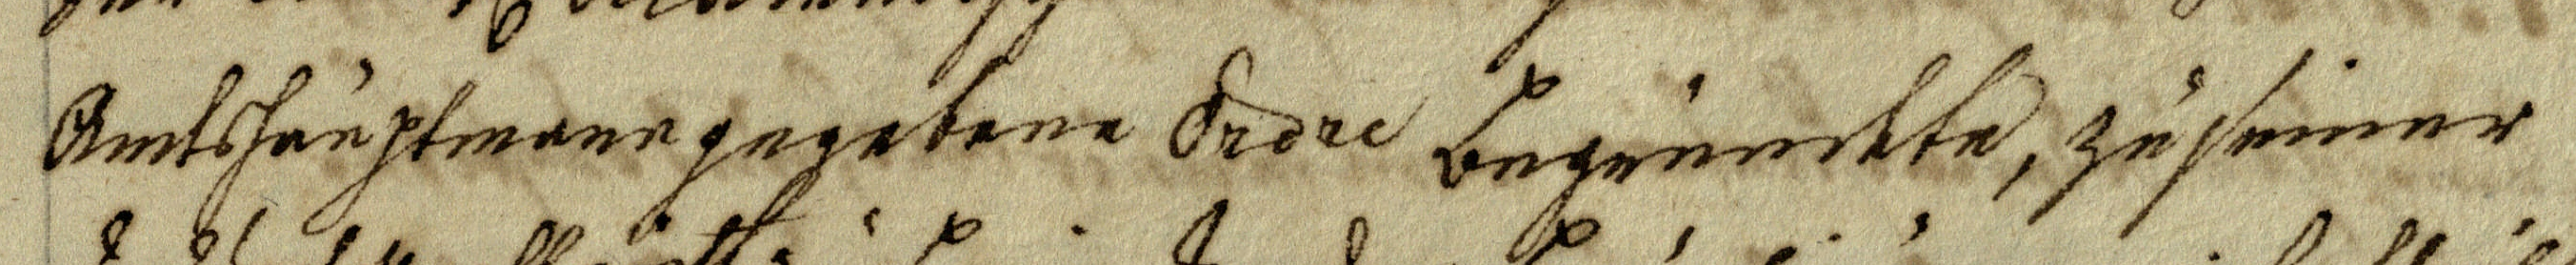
Amtshauptmann gegebene Ordre begründete, zu seiner
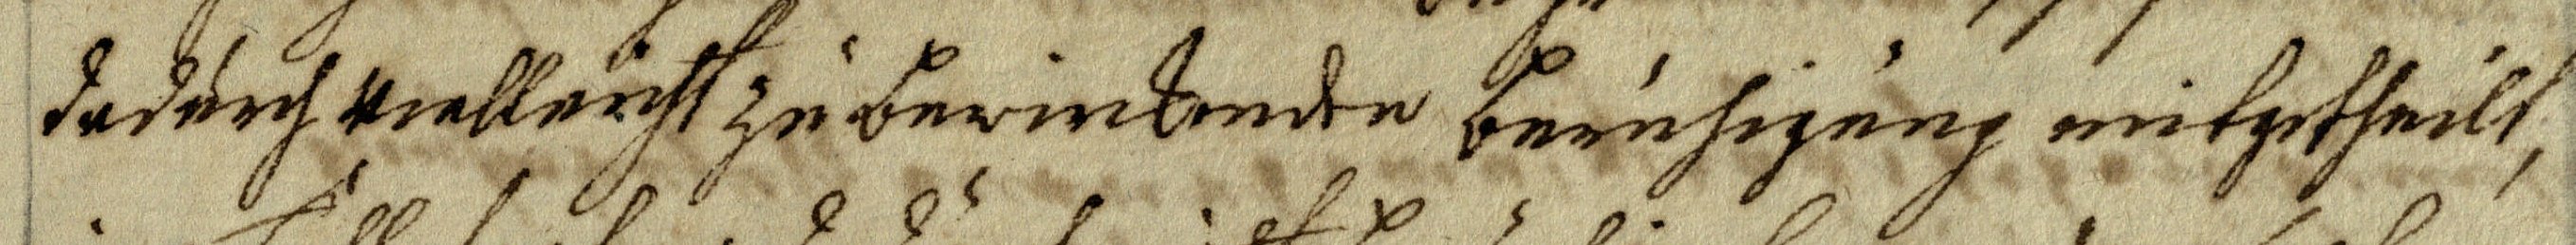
dadurch vielleicht zu bewirkenden Beruhigung mitgetheilt,
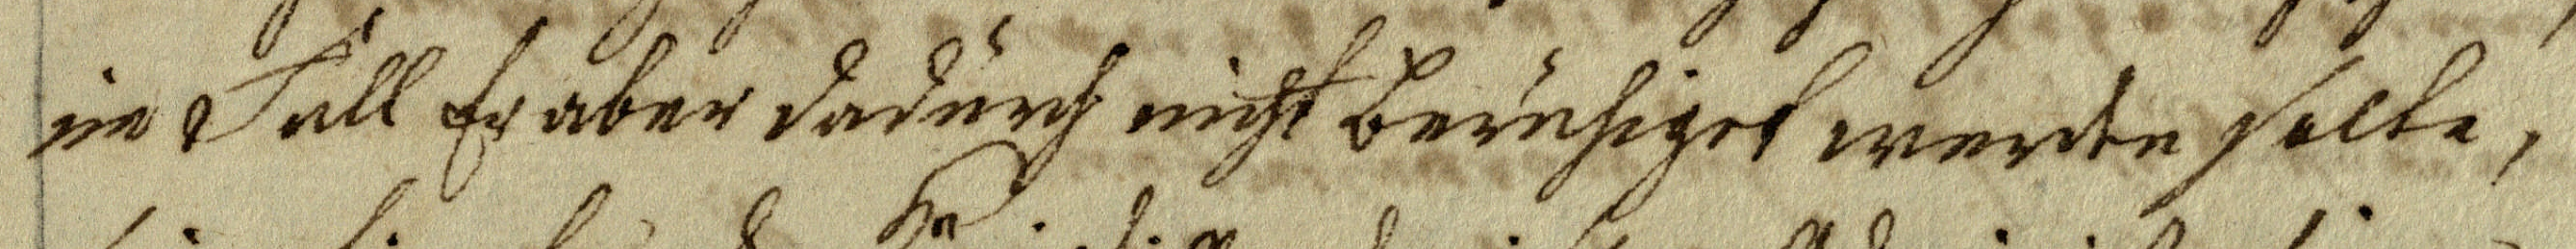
im Fall Er aber dadurch nicht beruhiget werden solte,
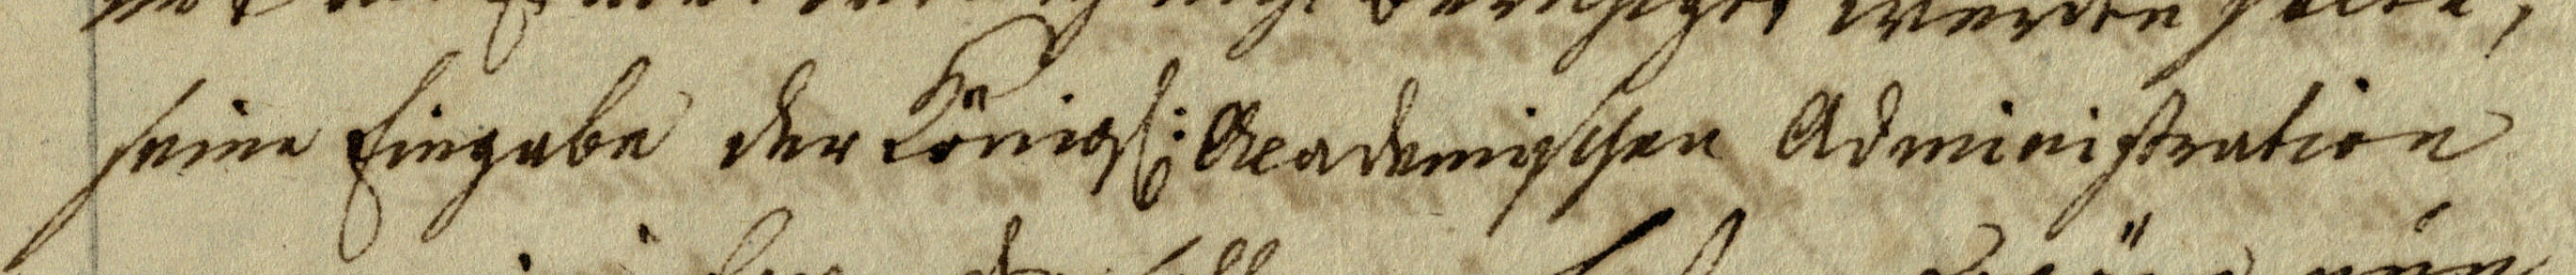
seine Eingabe der Königl. Academischen Administration
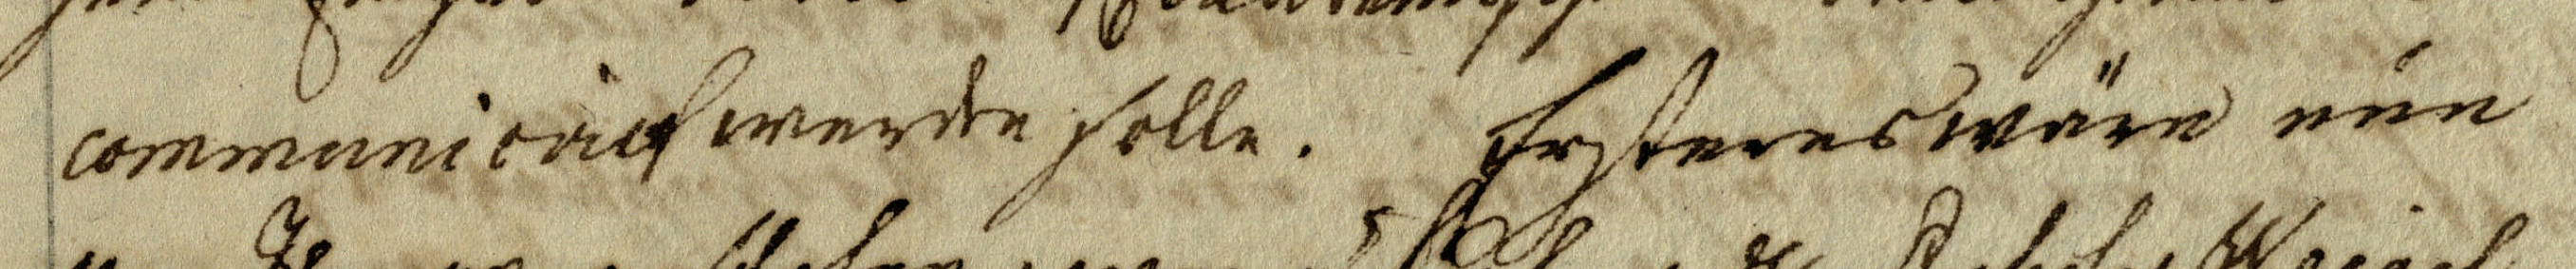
communiciret werden solle. Ersteres wäre nun
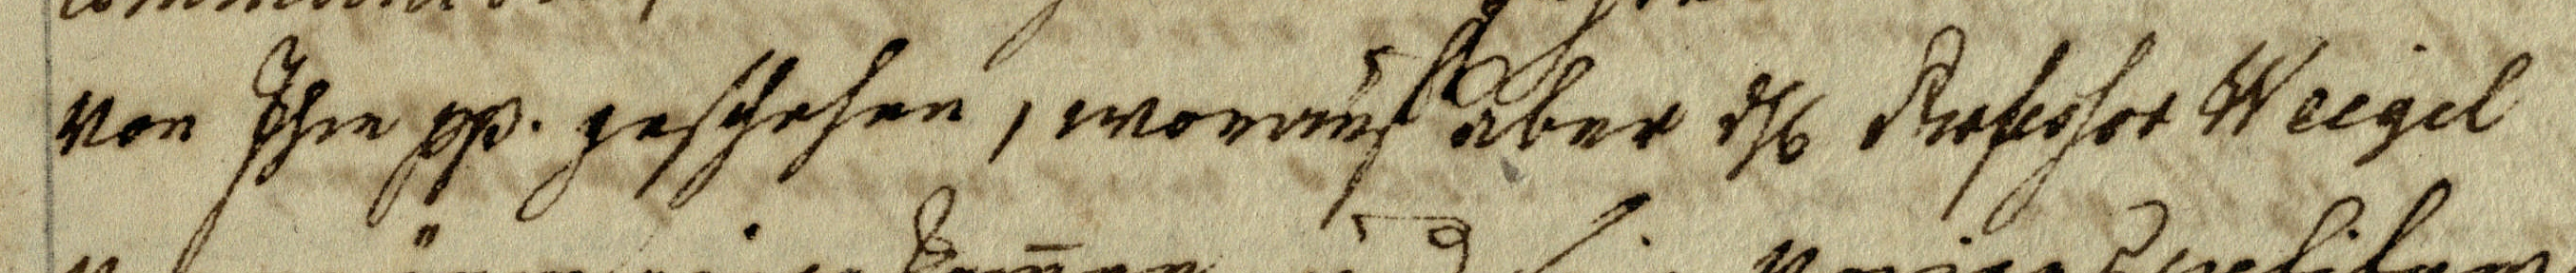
von Ihm pp. geschehen, worauf aber dh Professor Weigel
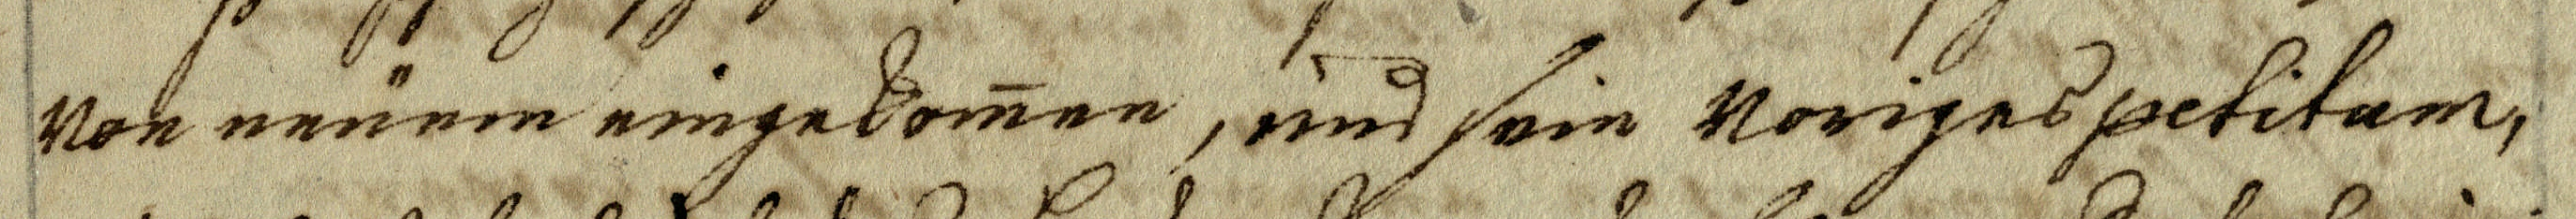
von neuem eingekomen, und sein voriges petitum,
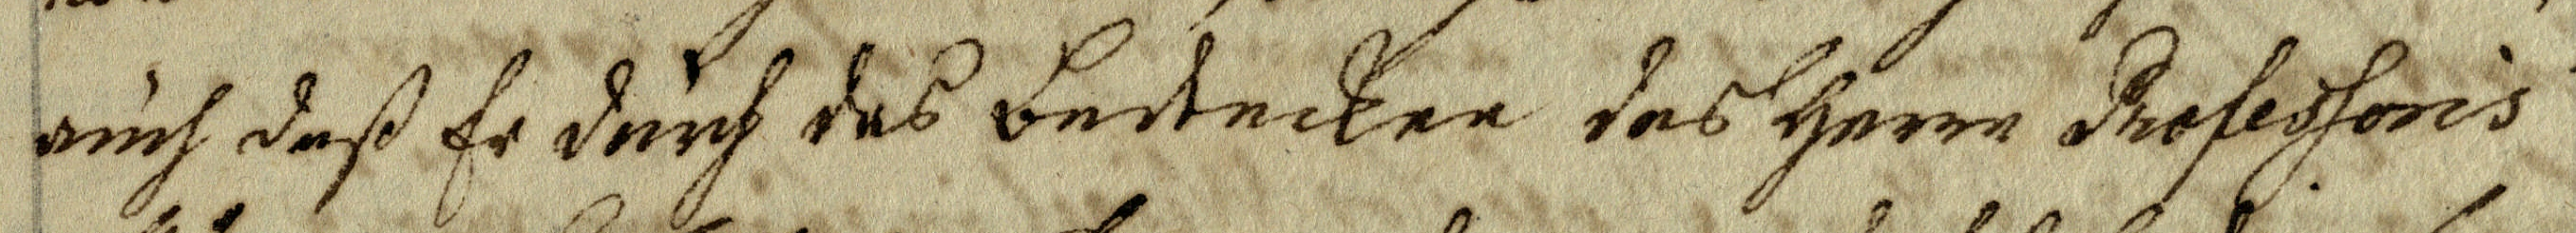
auch daß Er durch das Bedenken des Herrn Professoris
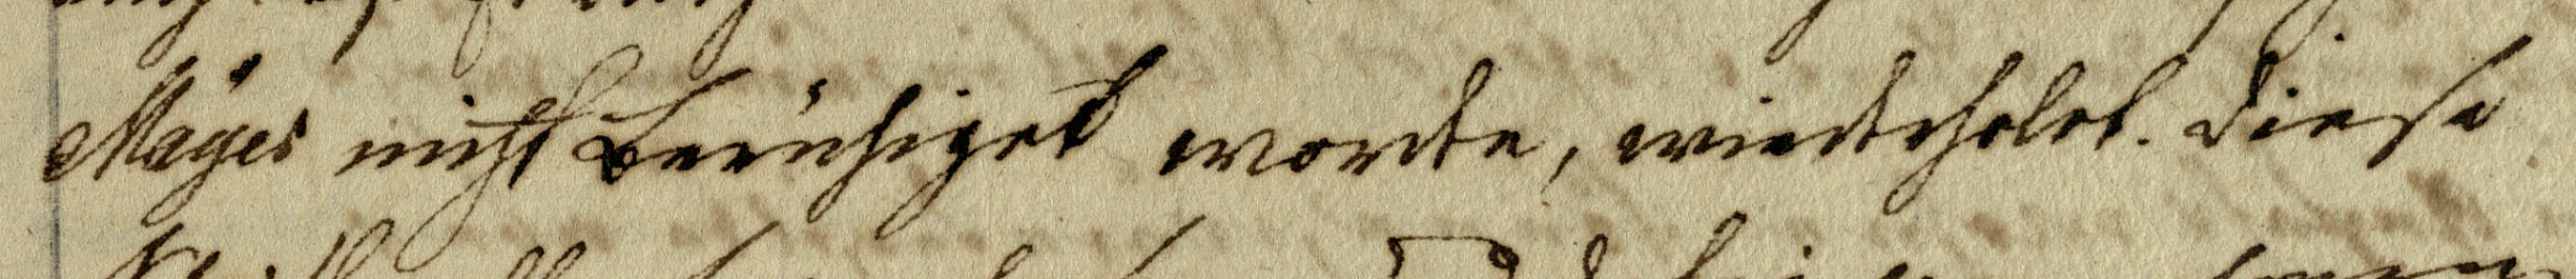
Maÿer nicht beruhiget worde, wiederholet. Diese
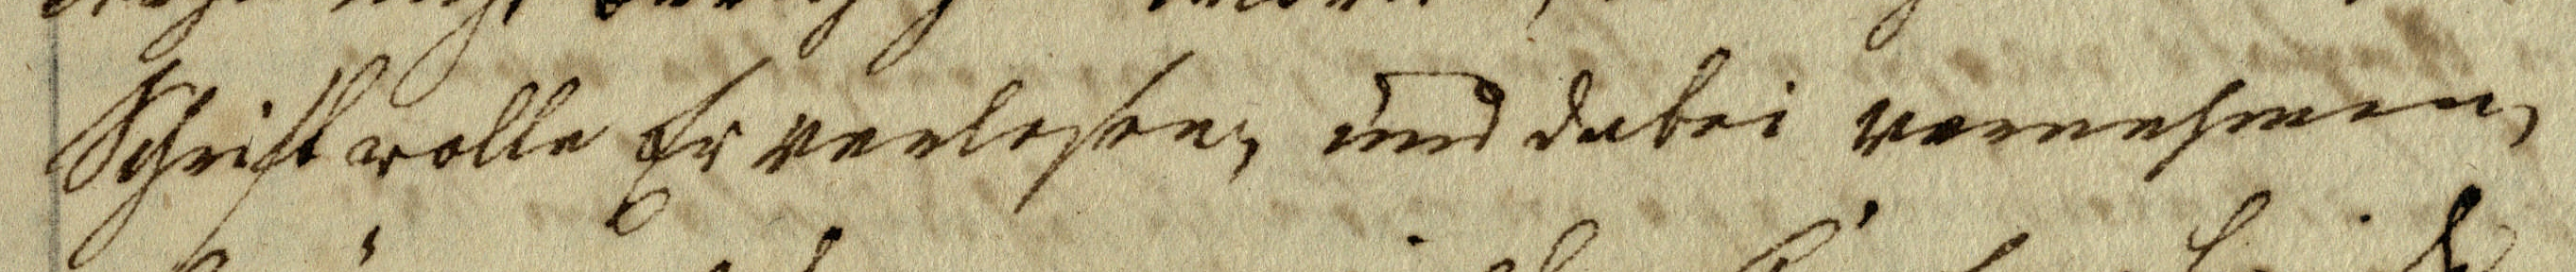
Schrift wolle Er verlesen, und dabei vernehmen,
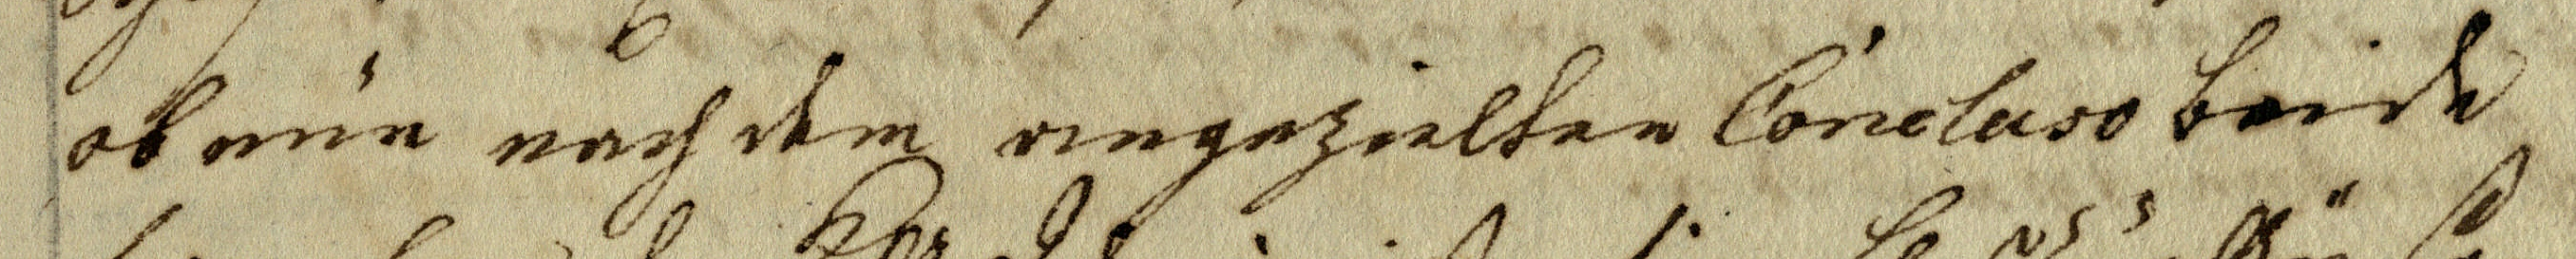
ob nun nach dem angezielten Concluso beide
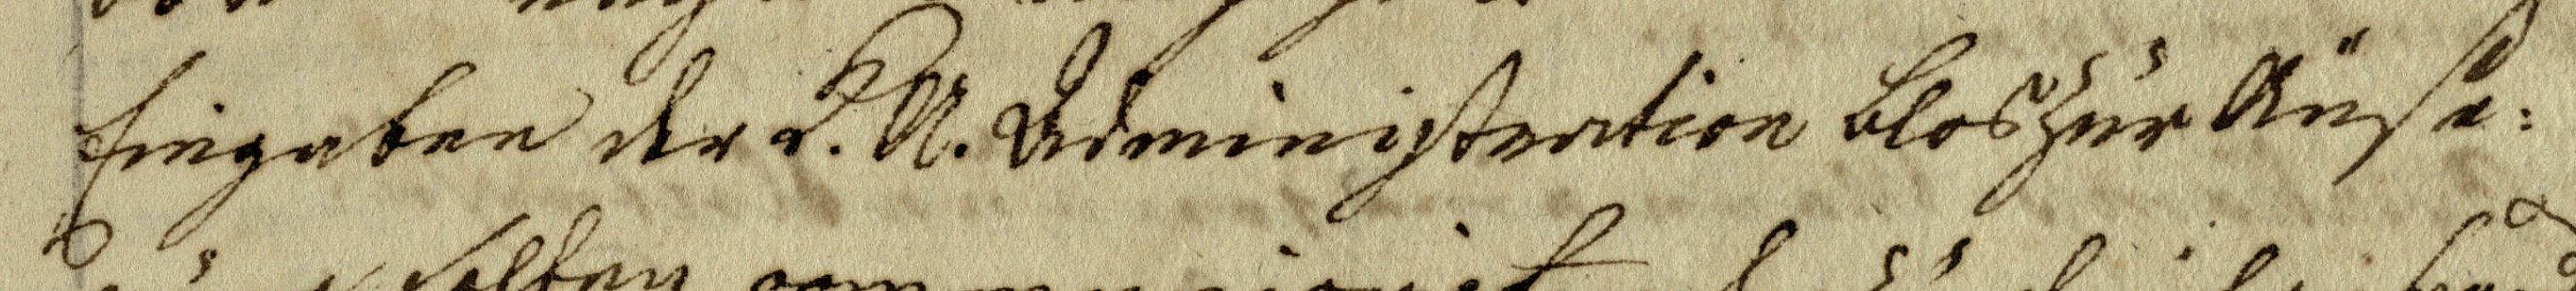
Eingaben der K. A. Administration blos zur Äuße¬
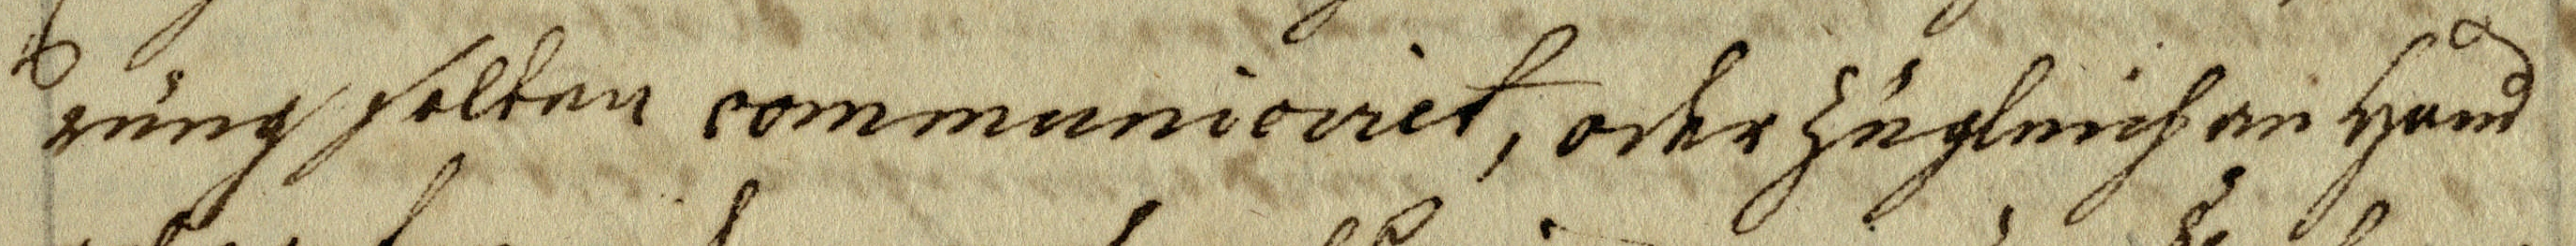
rung sollten communiciret, oder zugleich an Hand
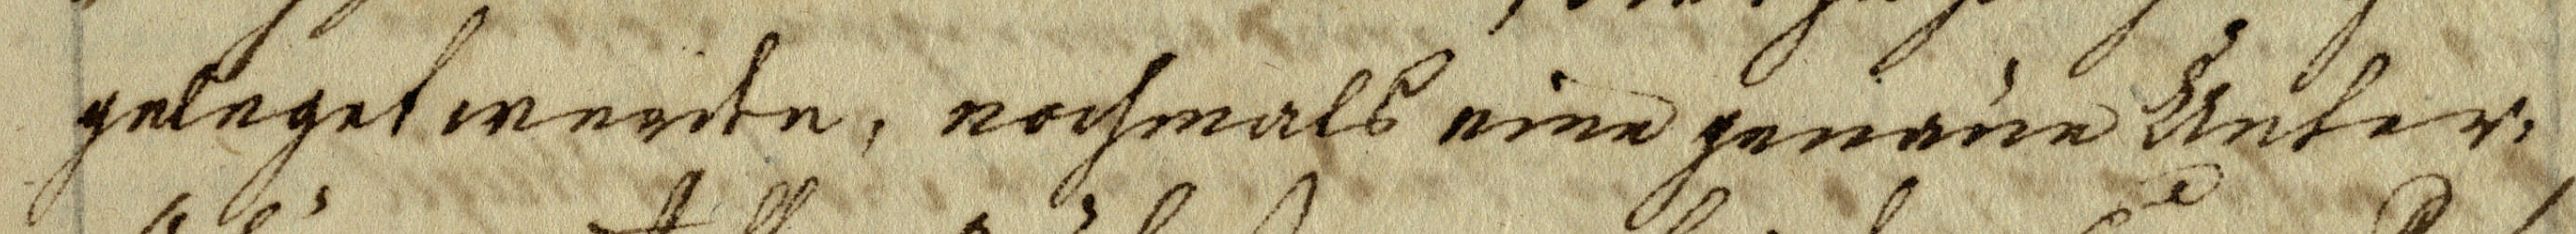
geleget werden, nochmals eine genaue Unter¬
